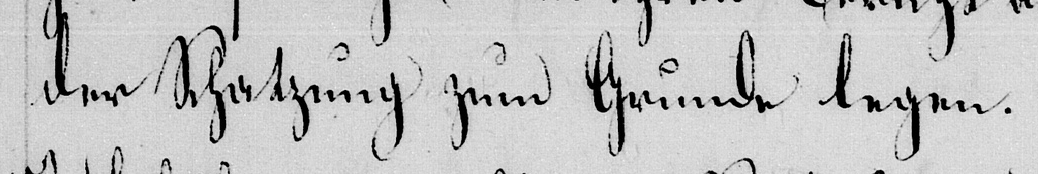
der Schatzung zum Grunde legen.
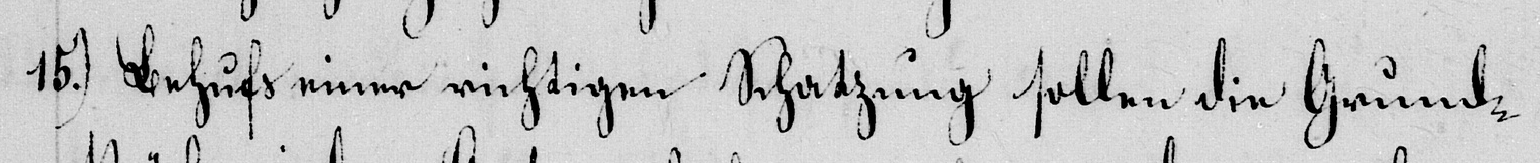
15.) Behufs einer richtigen Schatzung sollen die Grund¬
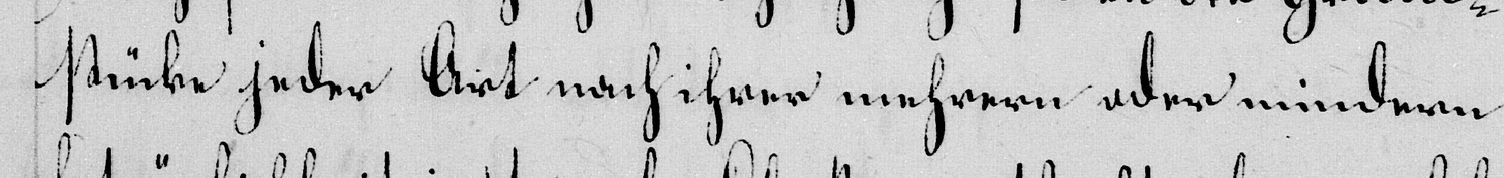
stücke jeder Art nach ihrer mehrern oder mindern
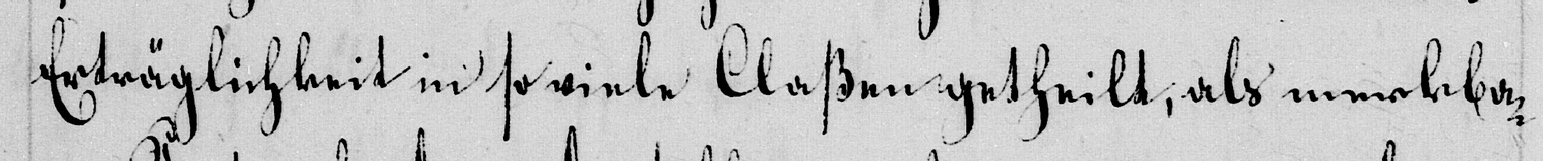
Erträglichkeit in so viele Claßen gehteilt, als merkba¬
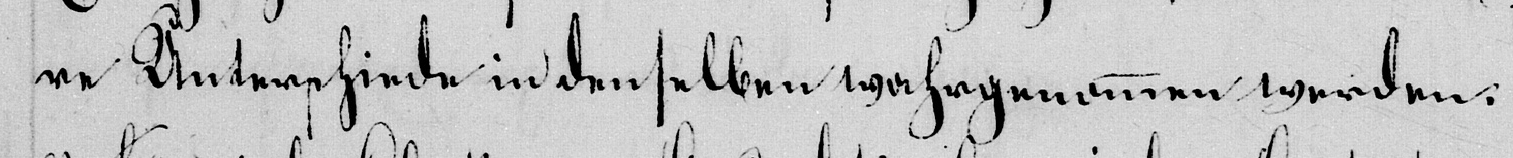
re Unterschiede in denselben wahrgenommen werden.
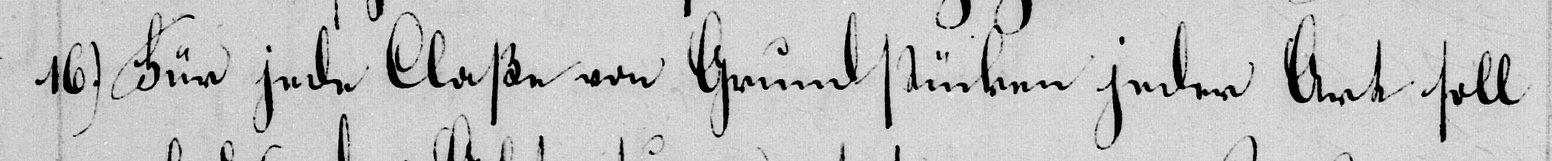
16.) Für jede Claße von Grundstücken jeder Art soll
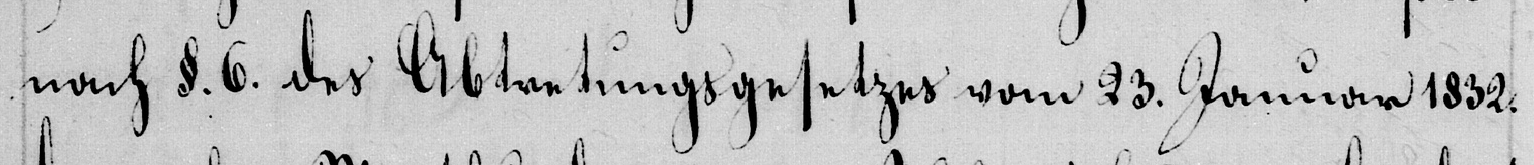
nach §. 6. des Abtretungsgesetzes vom 23. Januar 1832.
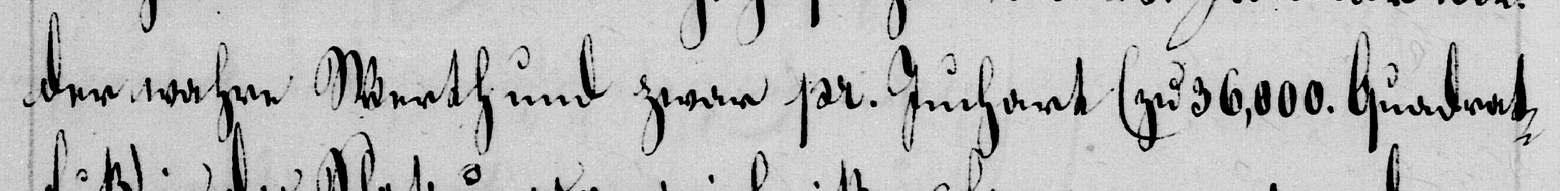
der wahre Werth und zwar pr. Juchart (zu 36,000. Quadrat¬
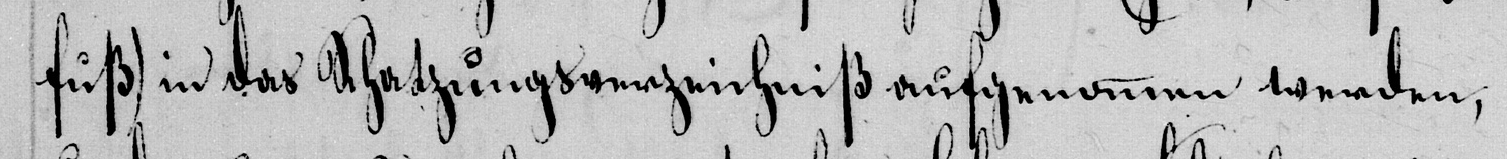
fuß) in das Schatzungsverzeichniß aufgenommen werden,
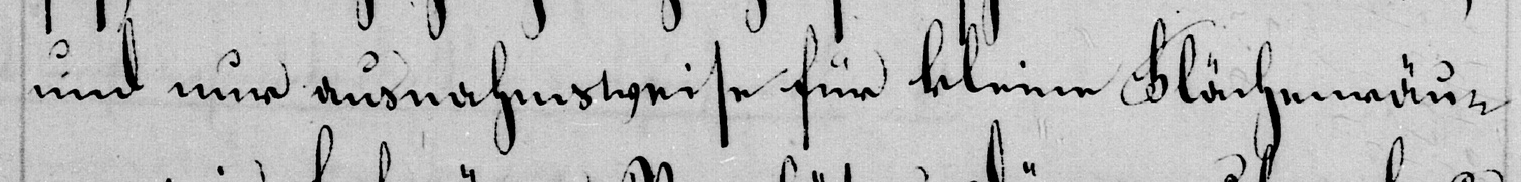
und nur ausnahmsweise für kleine Flächenräu¬
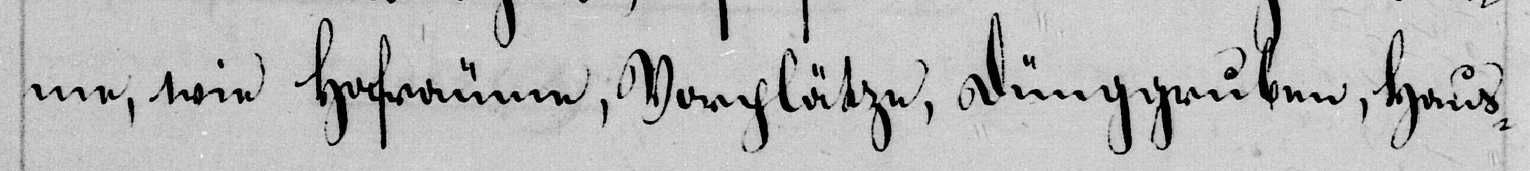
me, wie Hofräume, Vorplätze, Dünggruben, Haus-
